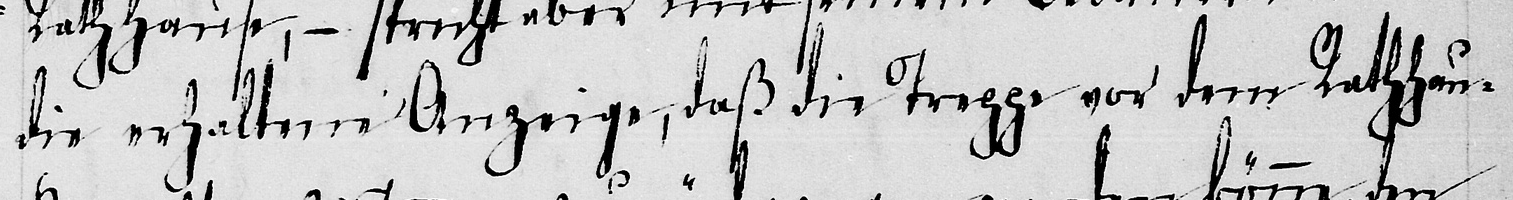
die erhaltene Anzeige, daß die Treppe vor dem Rathhau¬
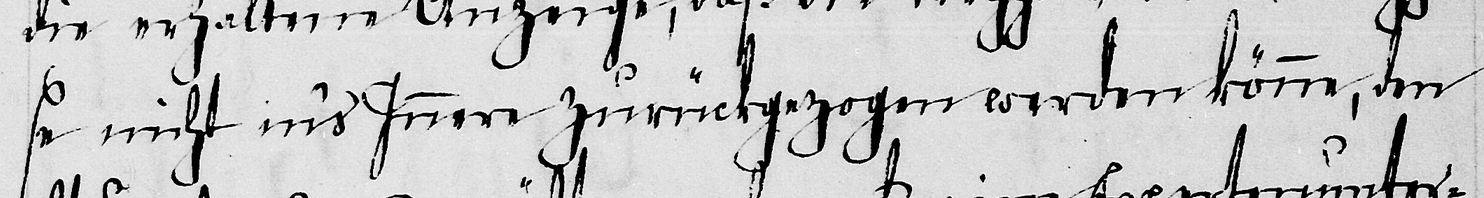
se nicht in’s Innere zurückgezogen werde könne, den
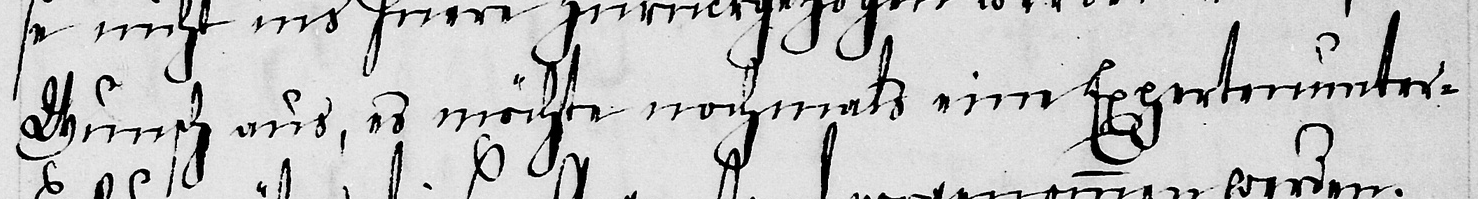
Wunsch aus, es möchte nochmals eine Expertenunter¬
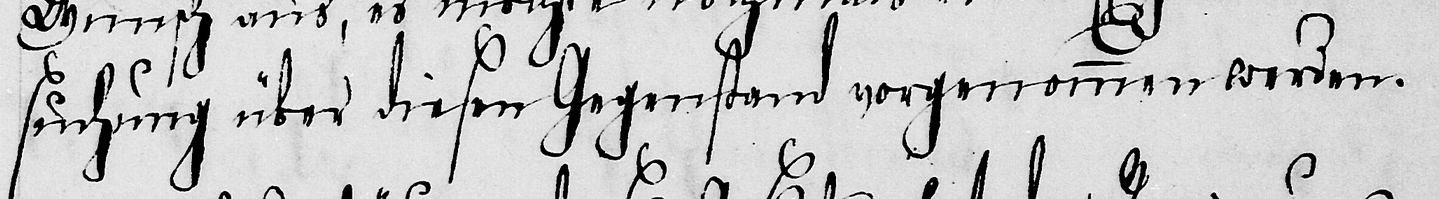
suchung über diesen Gegenstand vorgenommen werden.
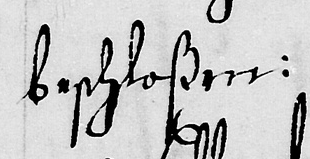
beschloßen:
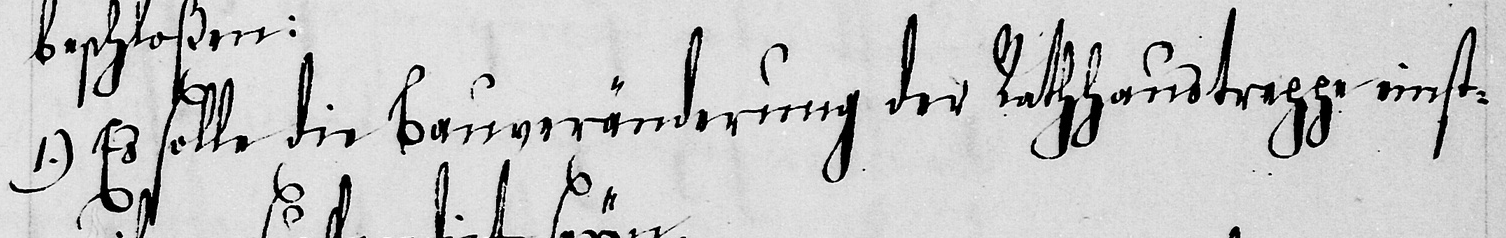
Es solle die Bauveränderung der Rathhaustreppe einst¬
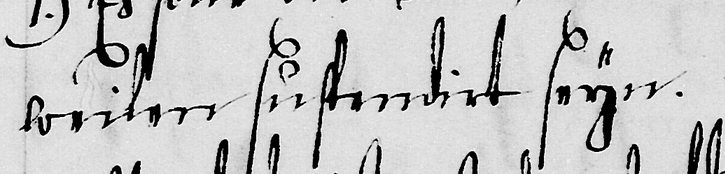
weilen suspendirt seyn.
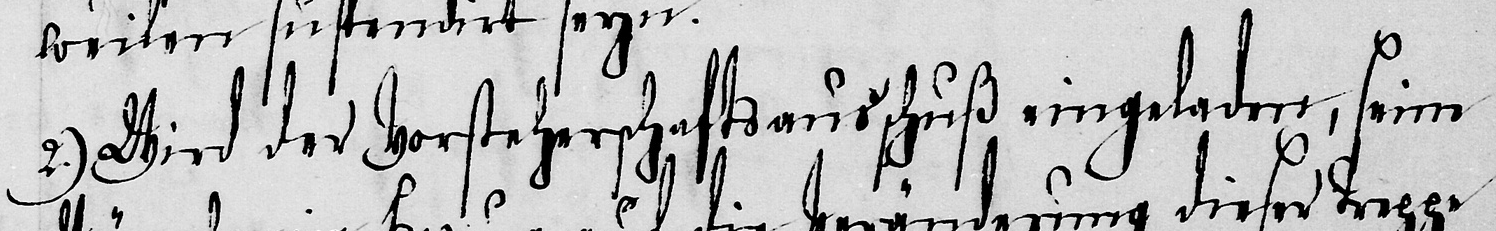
2.) Wird der Vorsteherschaftsausschuß eingeladen, seine
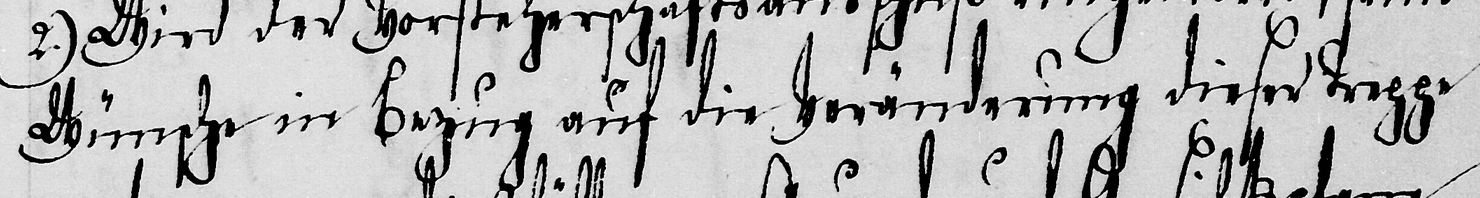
Wünsche in Bezug auf die Veränderung dieser Treppe
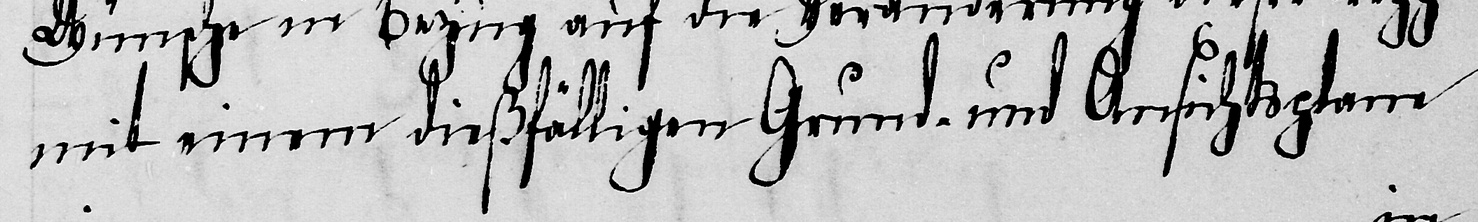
mit einem dießfälligen Grund- und Ansichtsplane
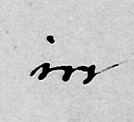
ge¬
